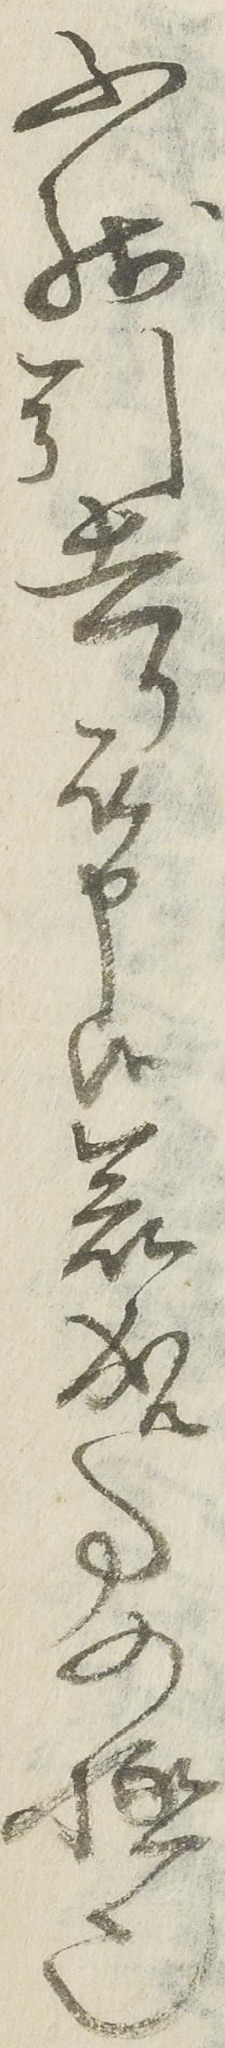不残引去り被申候哀成ル事の極也

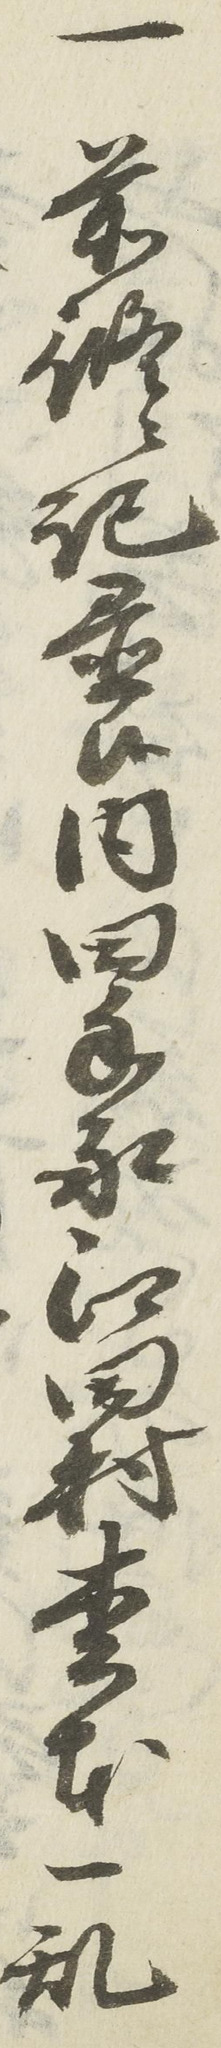一前条ニ記置候内田手永江田村松本一乱
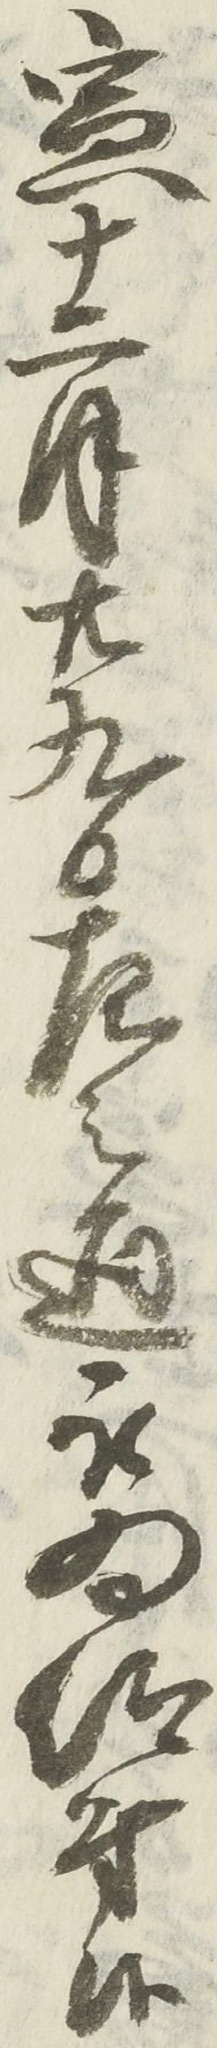寅十二月廿九日左之通被為仰付候
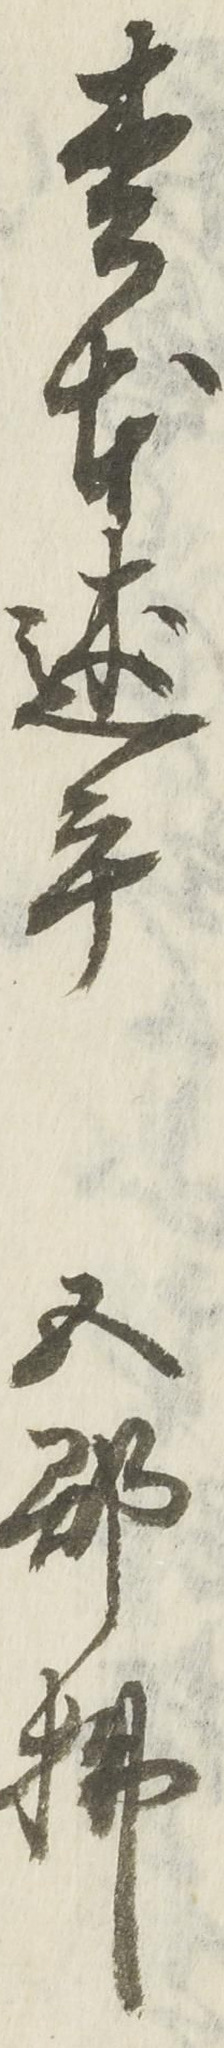松本述平五郡払
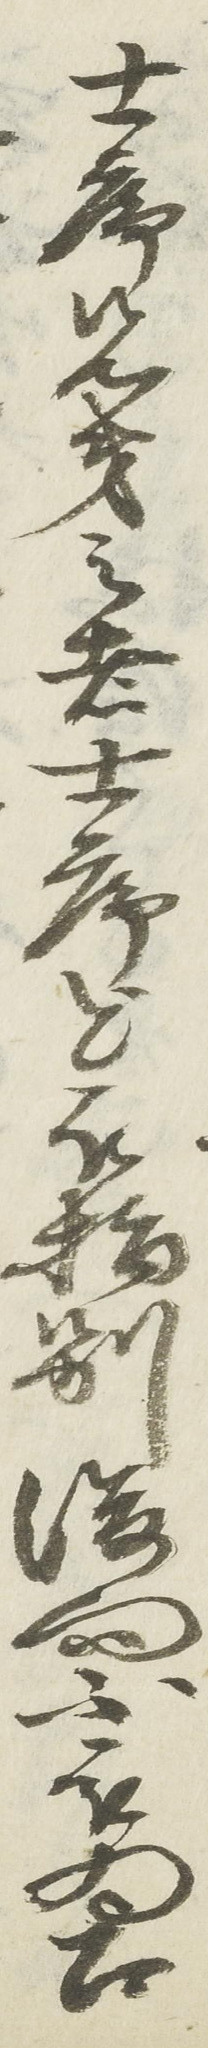士郎兄弟之者士郎を被指別後向不被為召
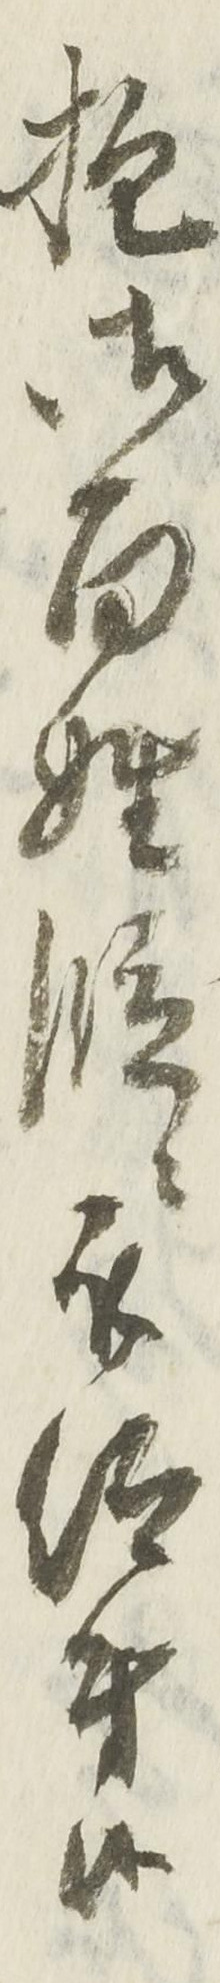抱御百姓段々被仰付候
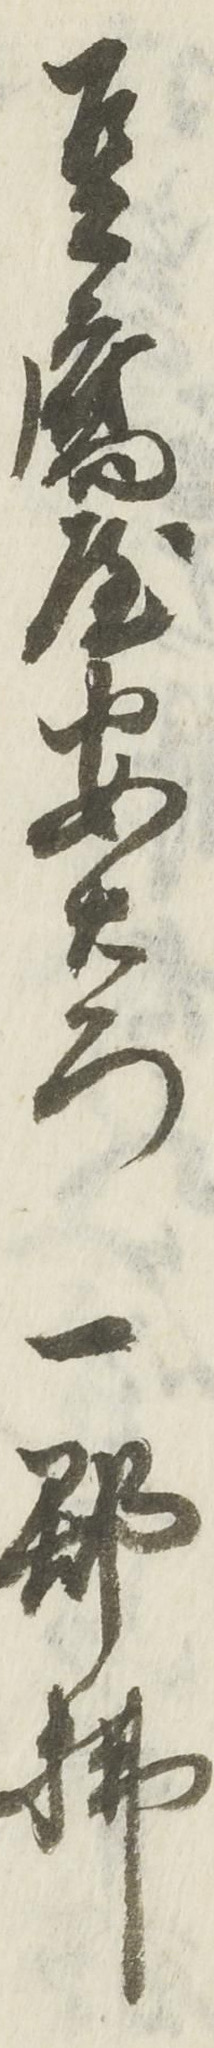豆腐屋安右衛門一郡払
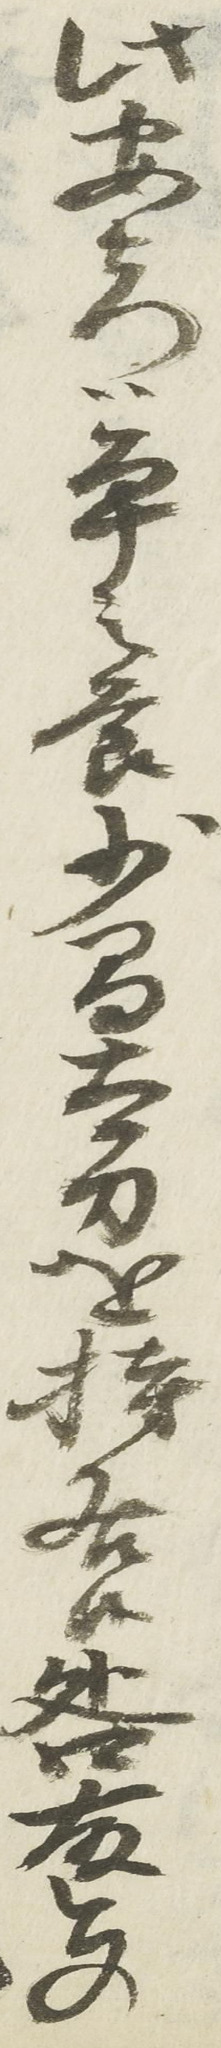此安右衛門は平之節少間太刀を持居候咎故との事
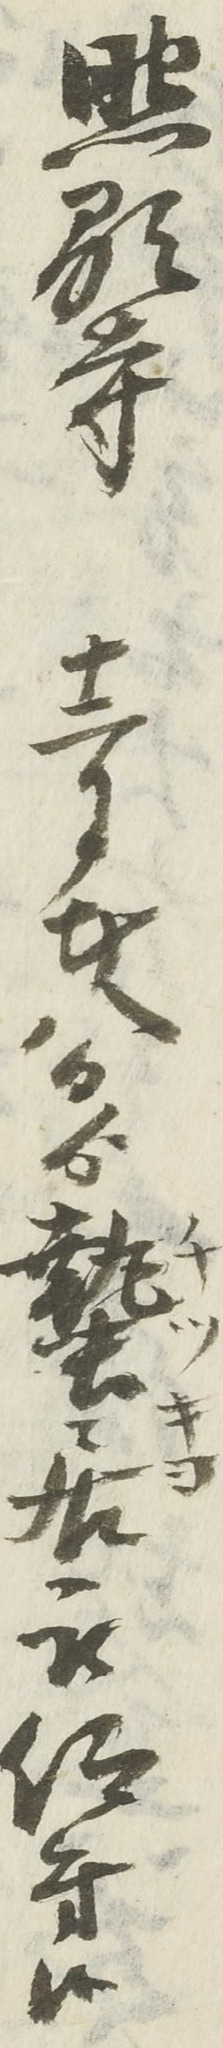照顕寺十二月廿八日ゟ蟄居被仰付候
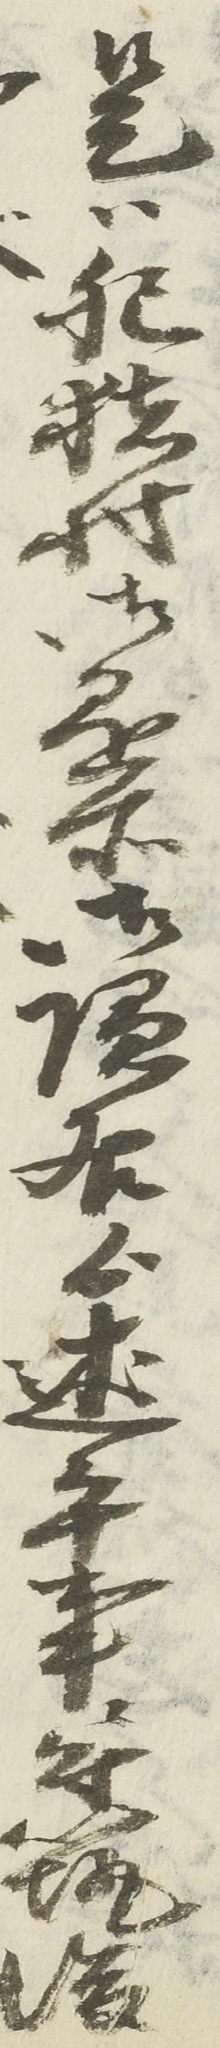是は肥横村御懸所御隠居ゟ述平事ニ付筑後
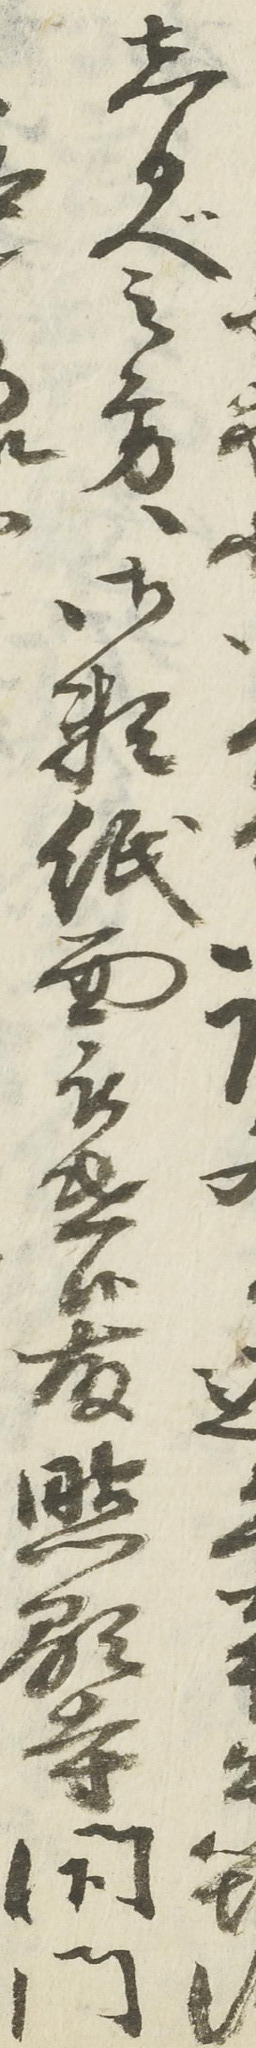しるべ之方へ御頼紙面被遣候故照顕寺閉門
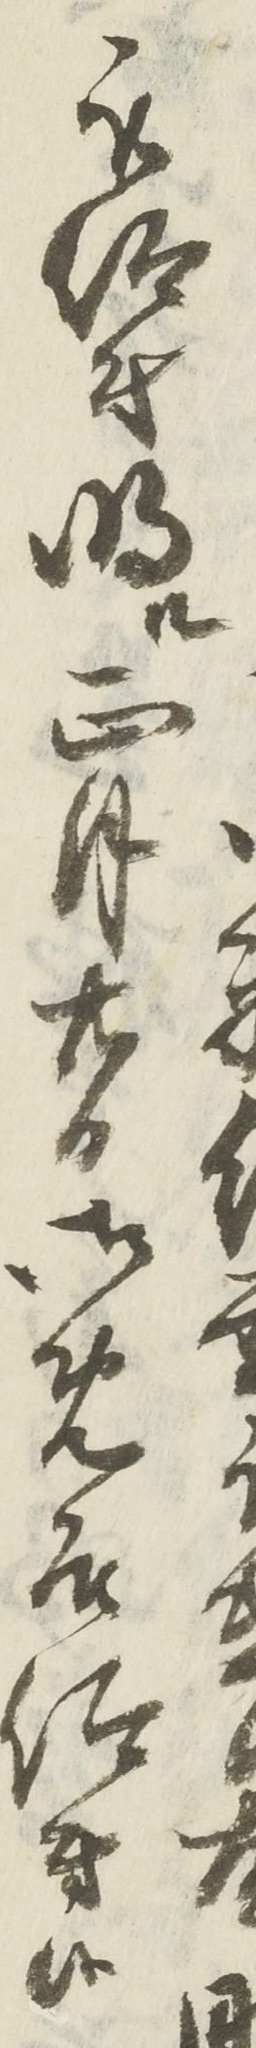被仰付明ル正月廿日御免被仰付候
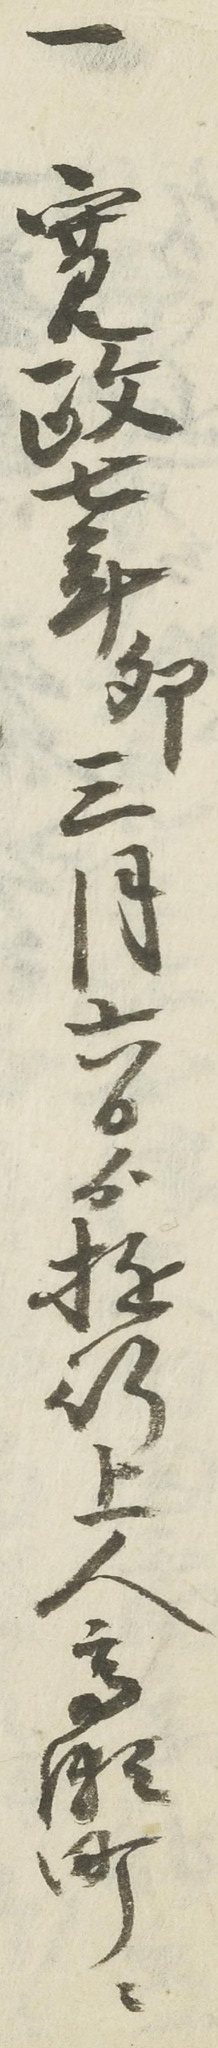一寛政七年卯三月六日ゟ遊行上人高瀬町ニ
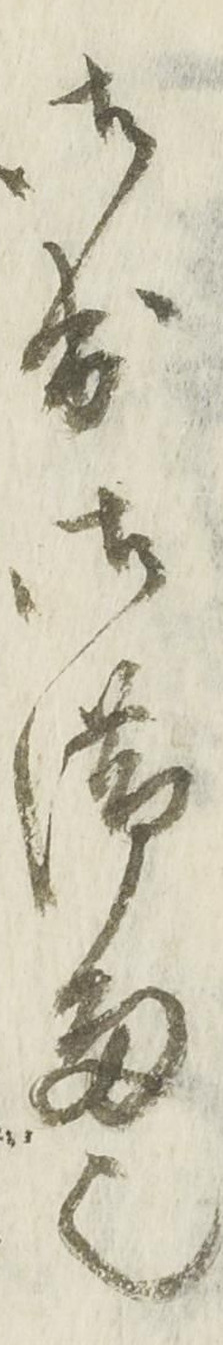御出御滞留也
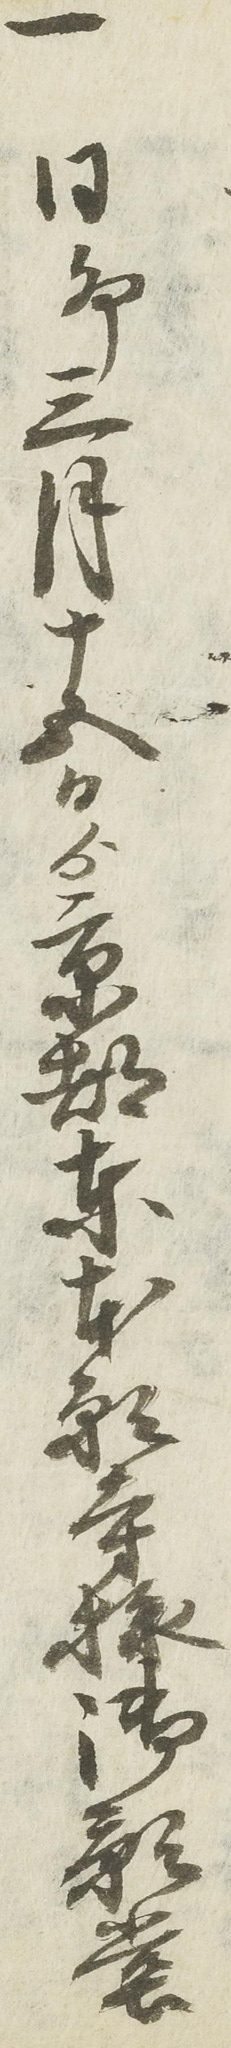一同卯三月十五日ゟ京都東本願寺様御影堂
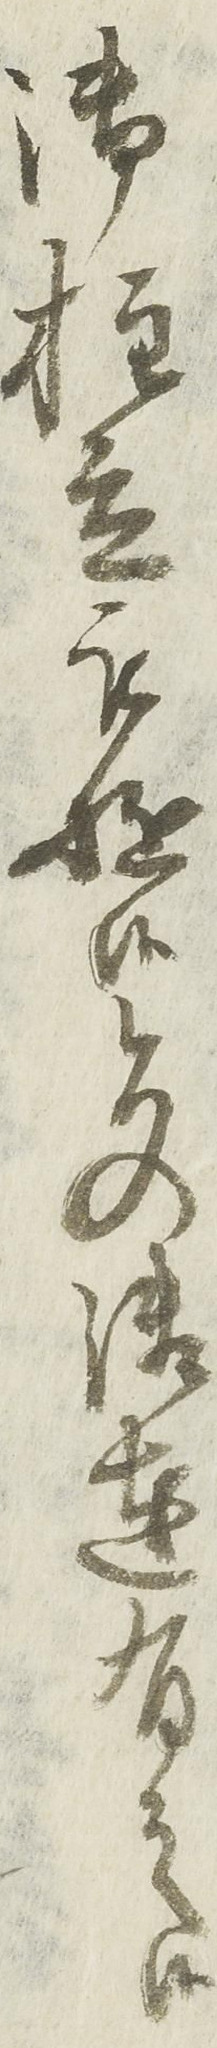御柱立被遊候との御達有之候
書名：後見笑
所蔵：東京大学地震研究所図書室 Earthquake Research Institute Library, The University of Tokyo, JAPAN
